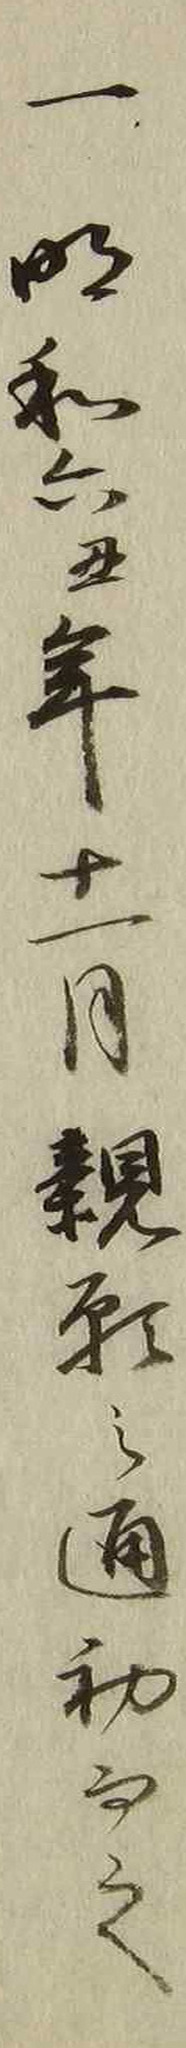一明和六丑年十一月親願之通初而之
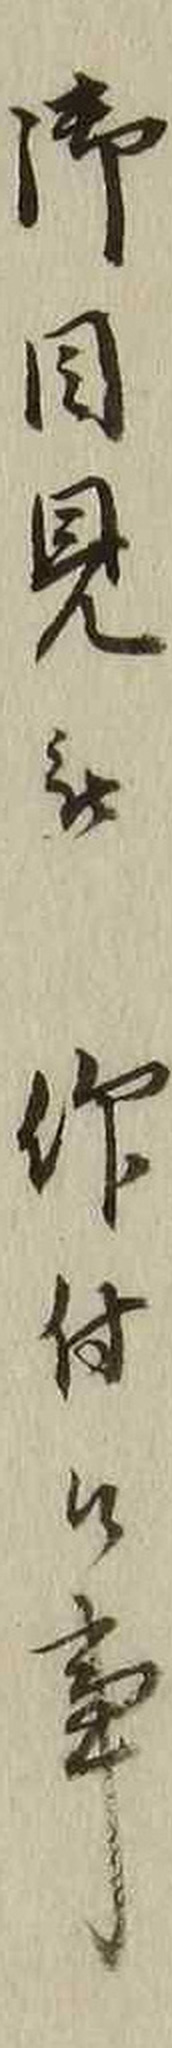御目見被仰付候事
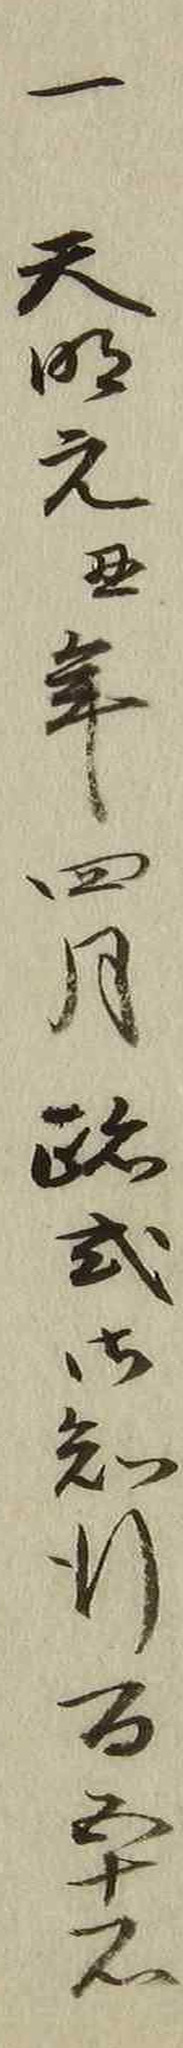一天明元丑年四月跡式御知行百五十石
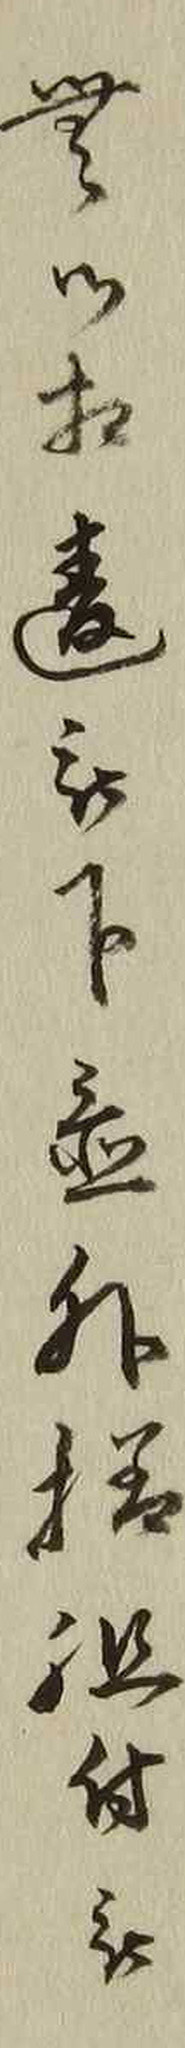無之相違被下置外様組付被
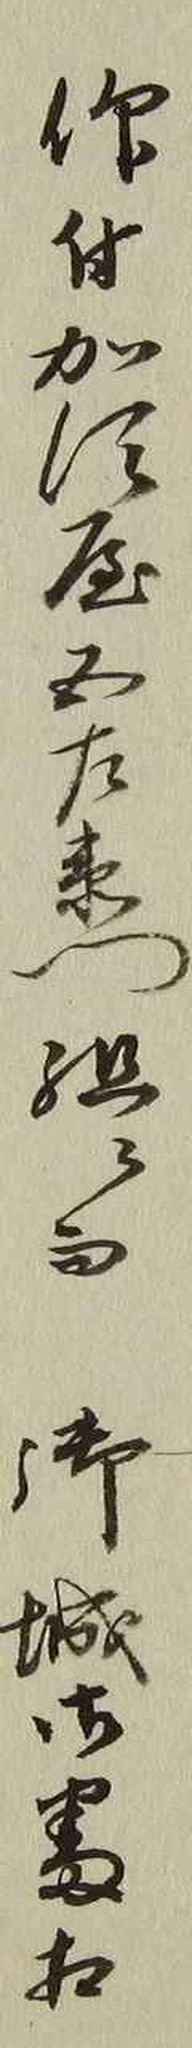仰付加須屋五左衛門組ニ而御城御番相
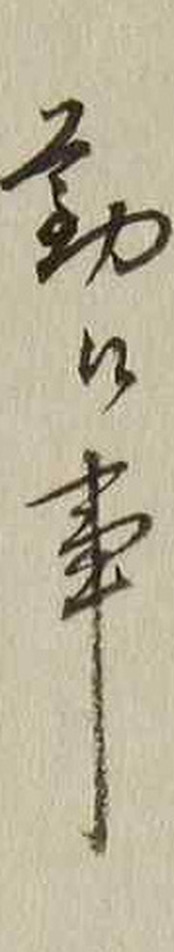勤候事
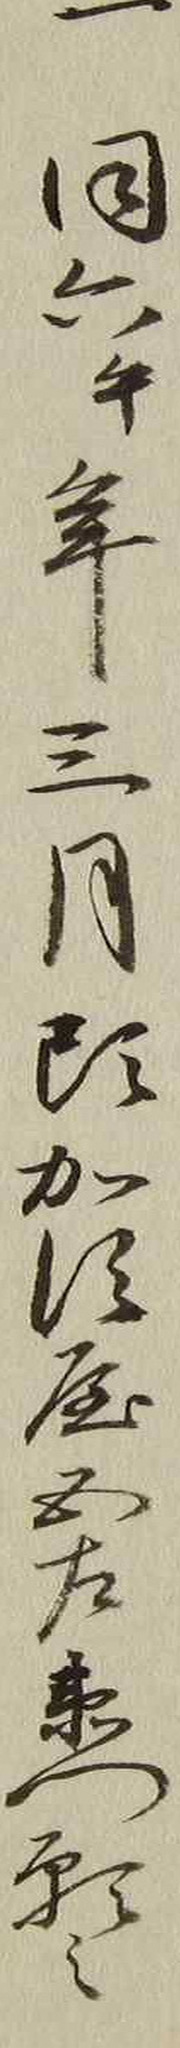一同年六午年三月頭加須屋五左衛門願之
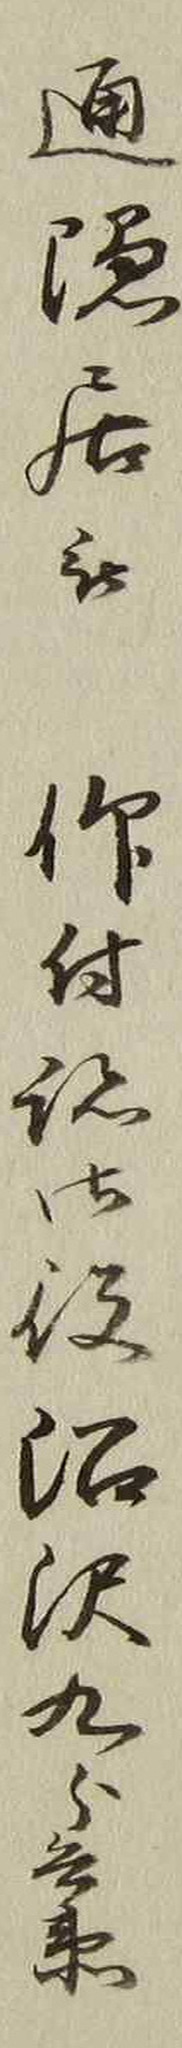通隠居被仰付跡御役沼沢九郎兵衛
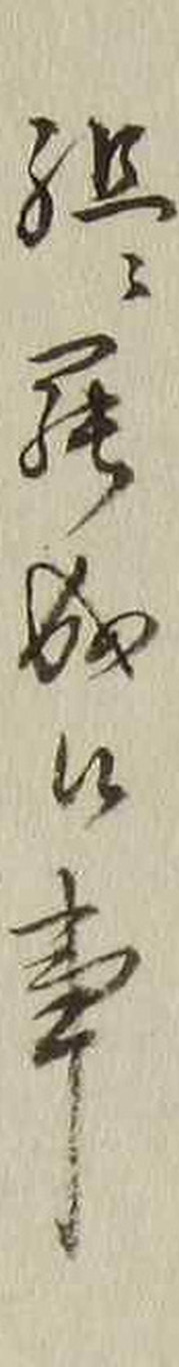組ニ罷成候事
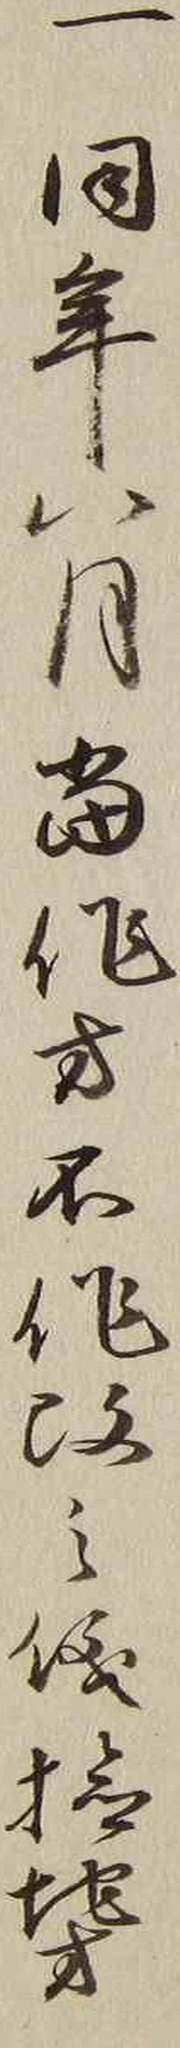一同年八月当作方不作役之儀検地方
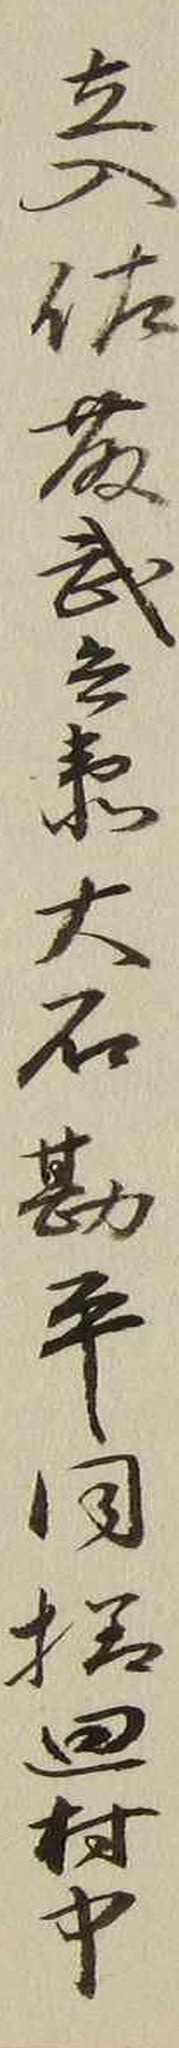立入佐藤武兵衛大石勘平同様廻村中
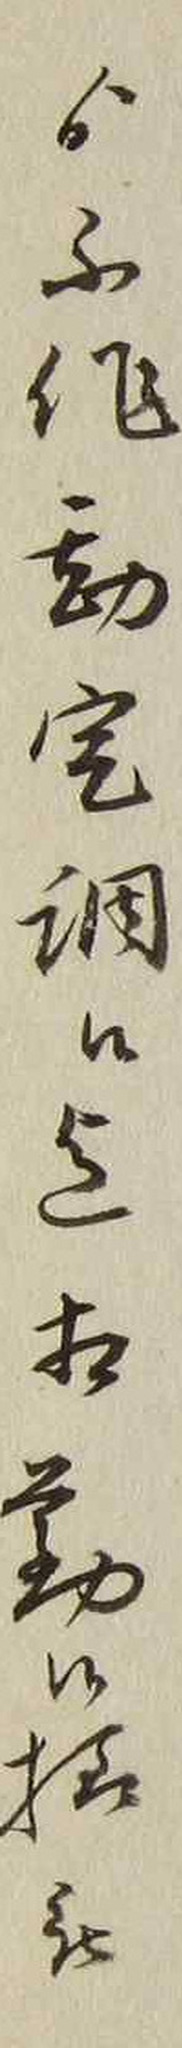ゟ不作勘定調候迄相勤候様被
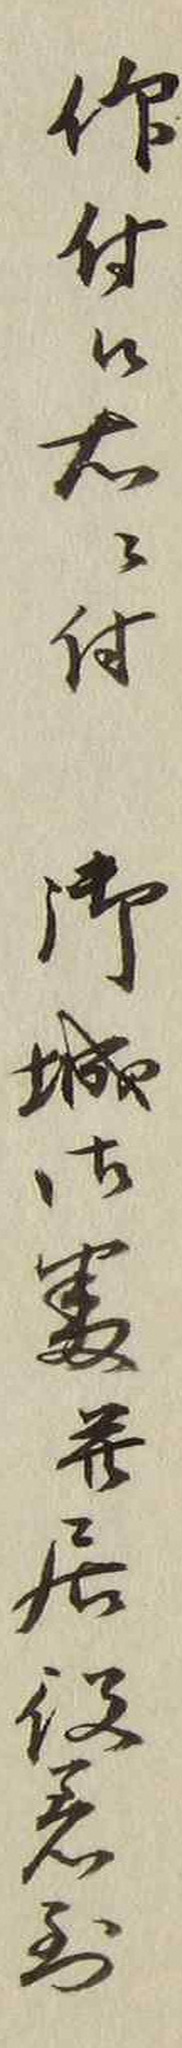仰付候右ニ付御城御番幷居役着到
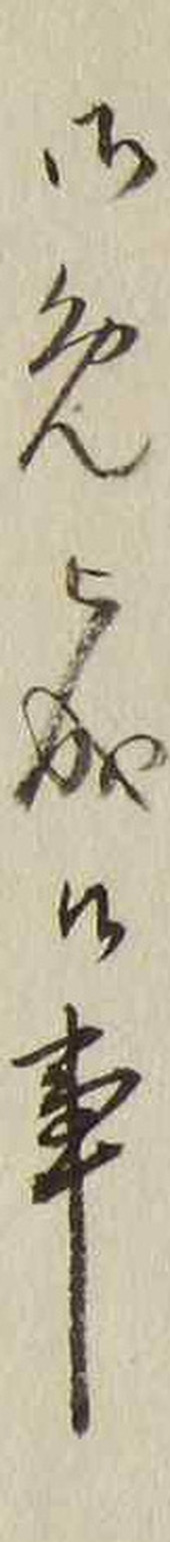御免被成候事

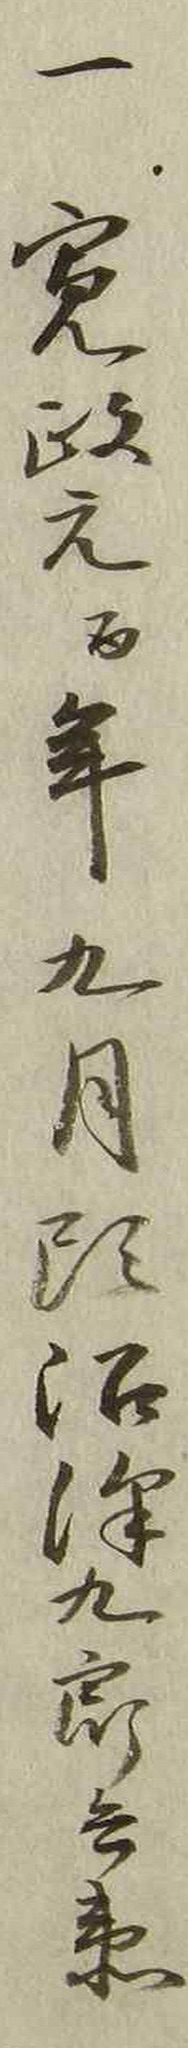一寛政元酉年九月頭沼澤九郎兵衛
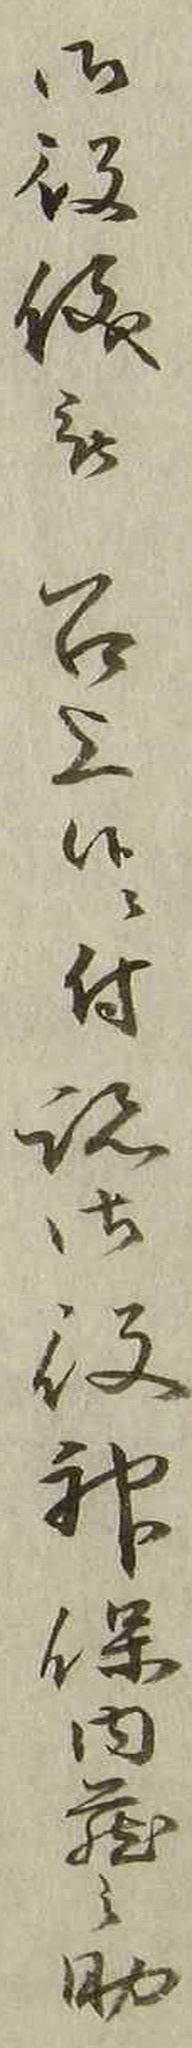御役儀被召上候ニ付跡御役神保内蔵之助
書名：諸士系譜　巻之128　た之部4
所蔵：会津若松市立会津図書館
